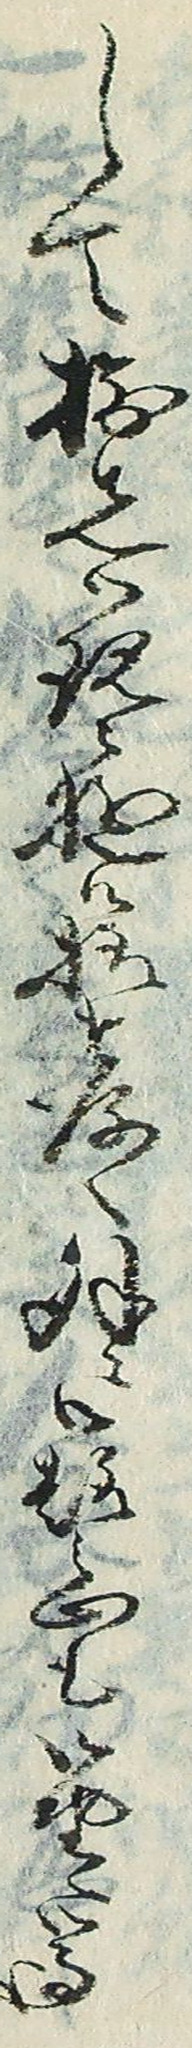して捌先御限被遊候様奉存候外に御趣意も御坐候御事哉
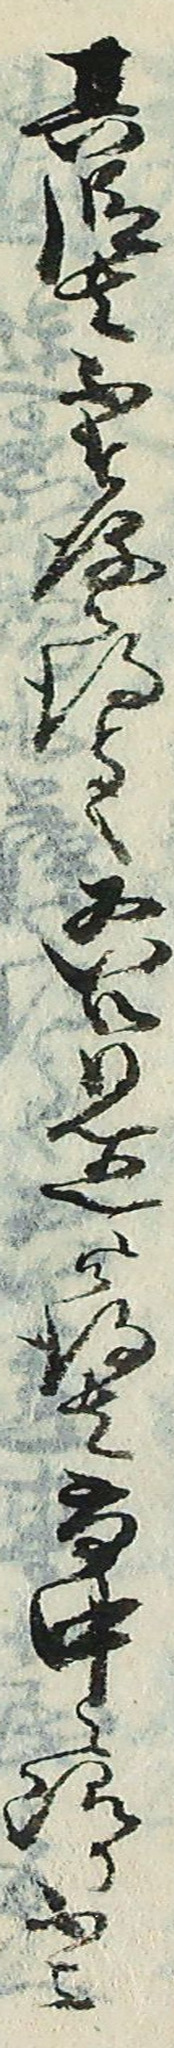其段者不奉存候得とも右御見込に候得者市中に限り不被
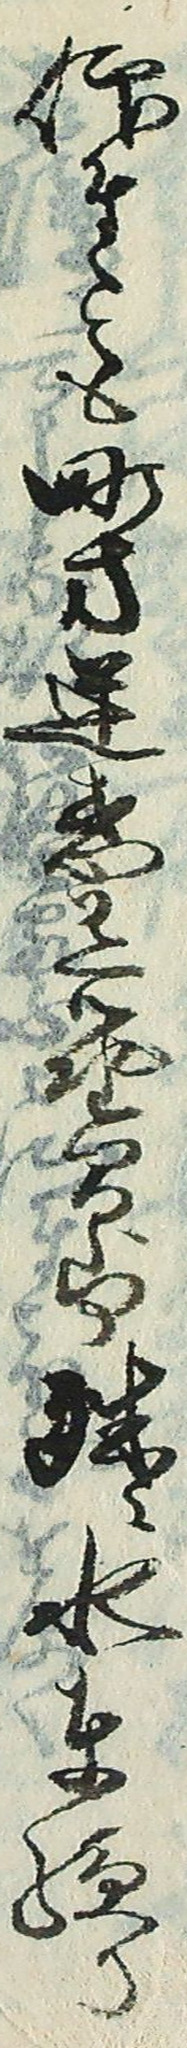仰付候とも町方迷惑有御坐間布殊に水車絞り
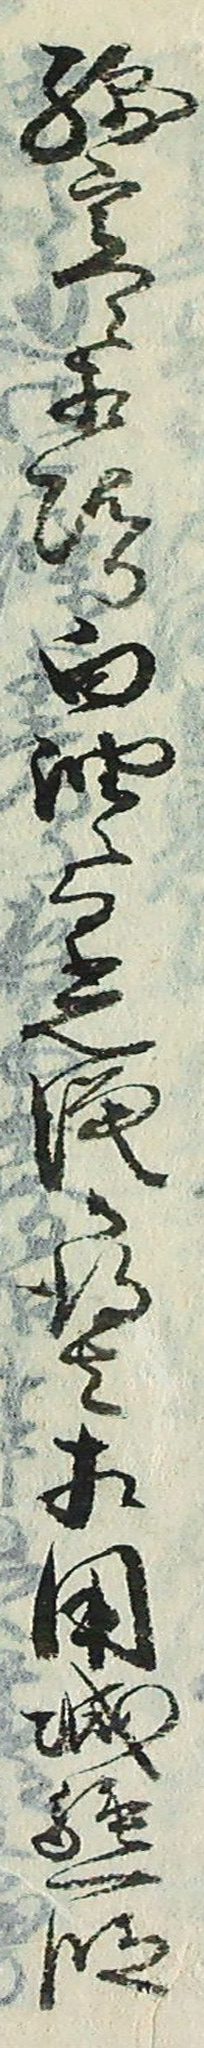綿実に相限り白油に而光増候得者相用減強一段
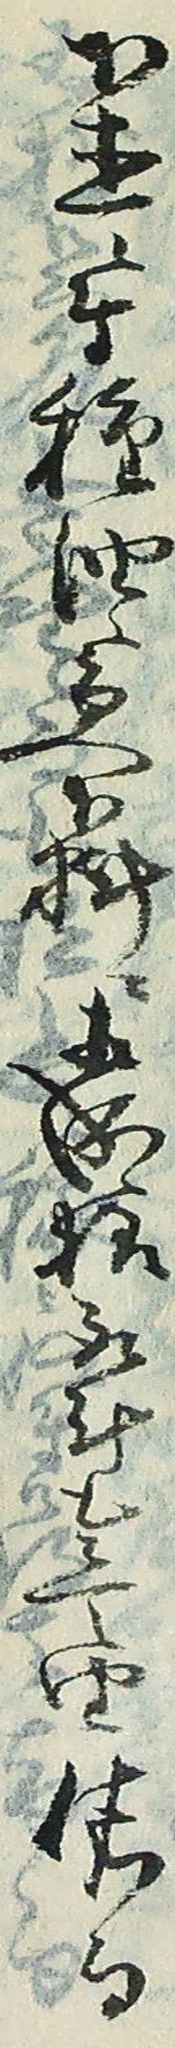下直に付種油に負下料相成候様取計も有之由依而
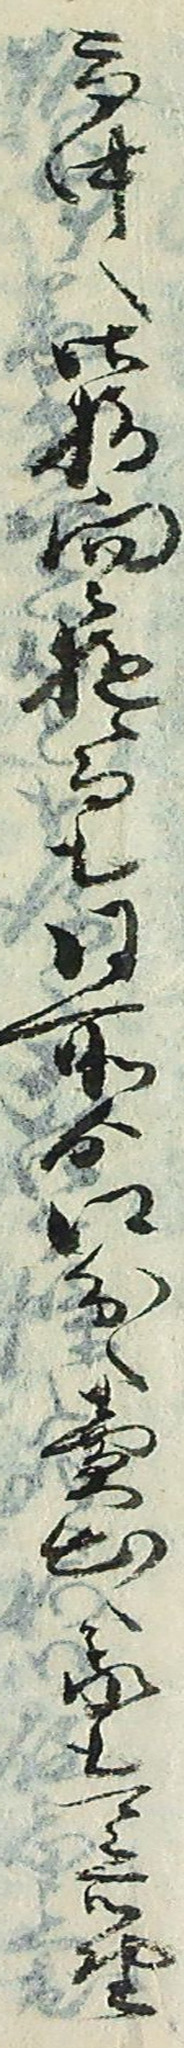市中へ御指向被遊候而も同所ゟ郷分へ売出候義も可有御坐
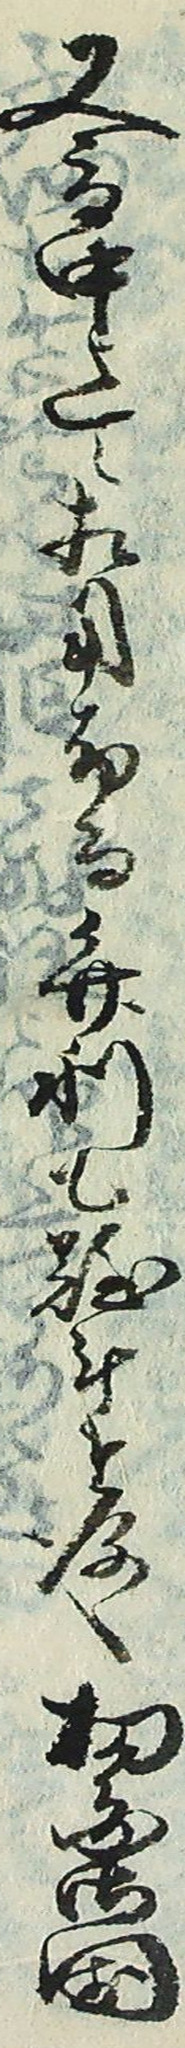又市中迄に相用却而弁利も難計奉存候扨亦御国
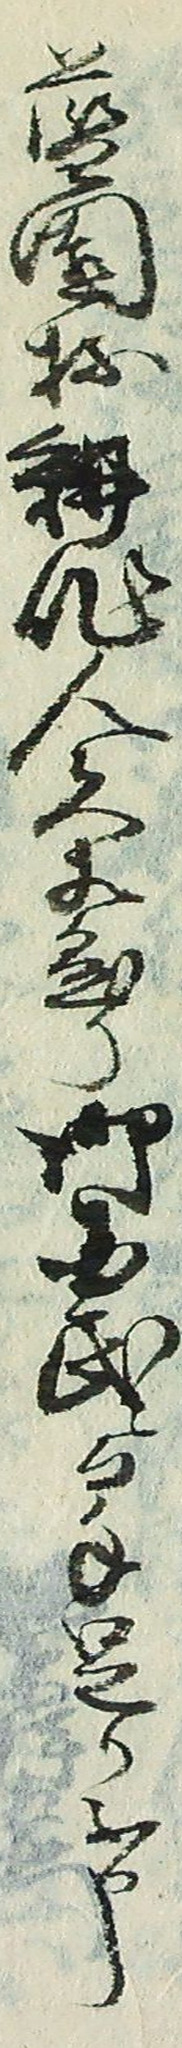藍園抔耕作人夫相懸り御国民に而手足り不申
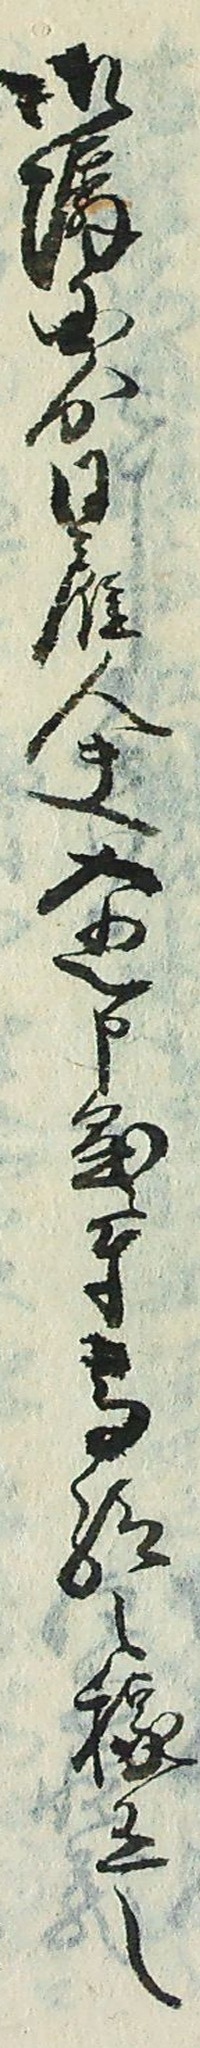御隣国ゟ日雇人夫入込申懸に付高給之稼有之
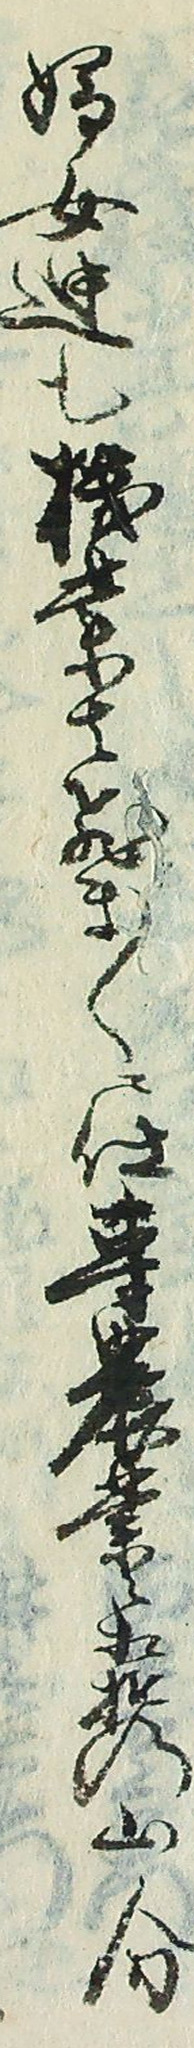婦女迚も機業者ひま〳〵に仕専農業に相携山分
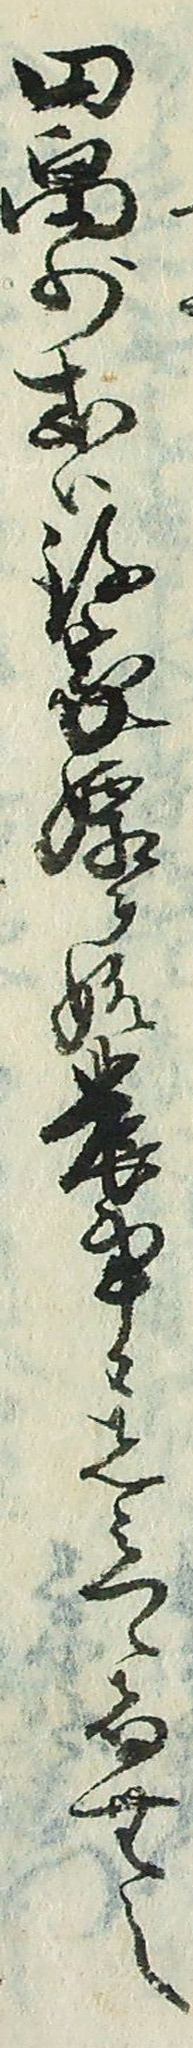田畠少或は後家嫁を始農事に先立候者無之
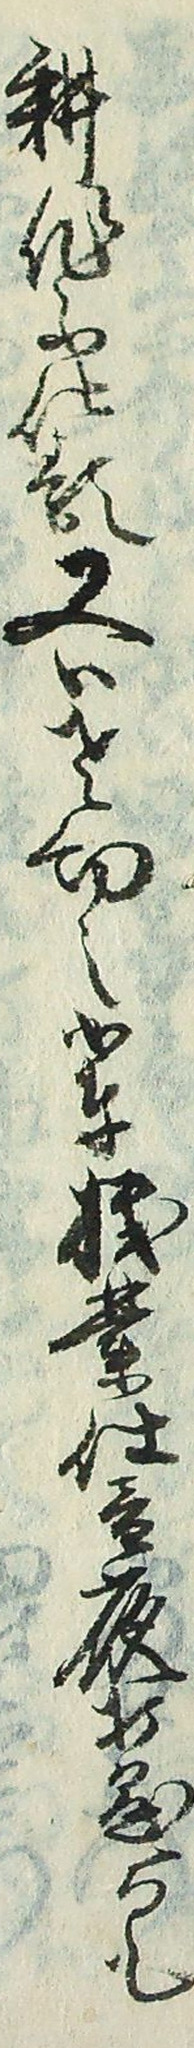耕作不仕類又は老幼之輩機業仕昼夜打懸候而も
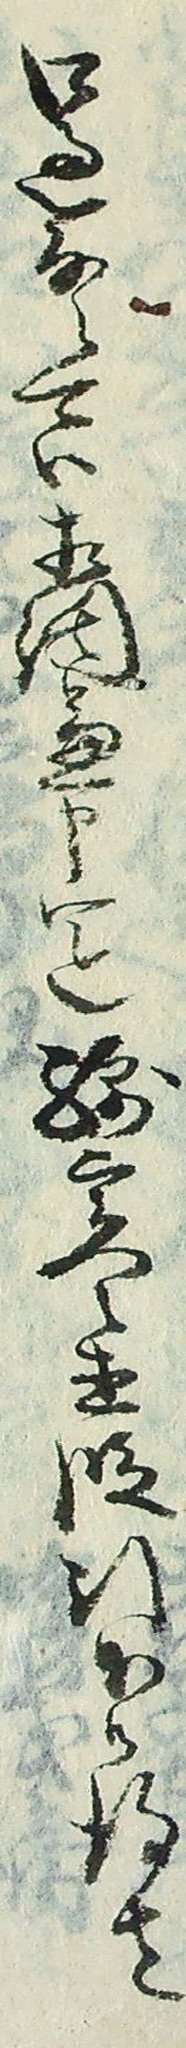口過ならては相調兼申を綿実之直段引下候得者
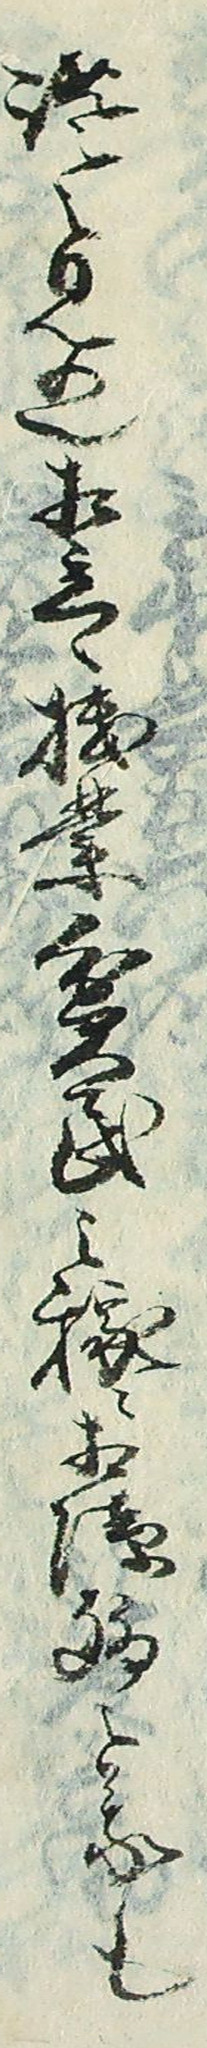纔之見込相立候機業貧民之稼に相障聊之義も
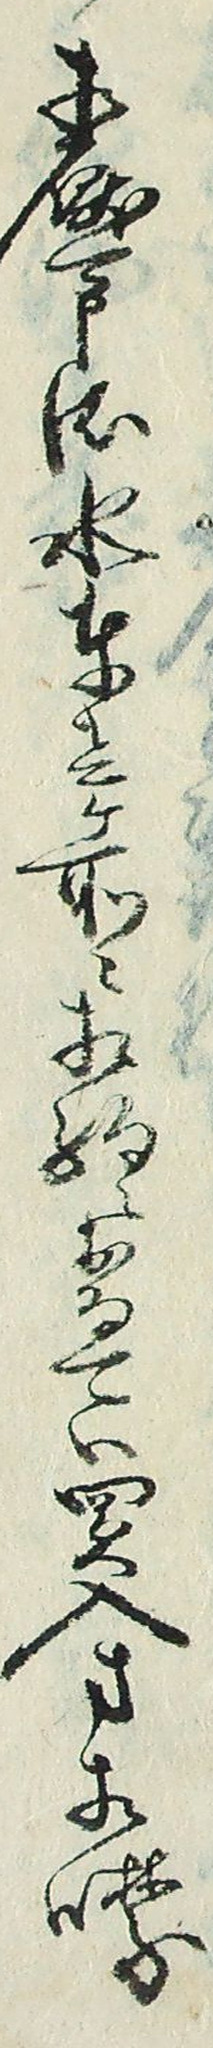相厭可申所水車壱ケ所に相約におゐては買入方

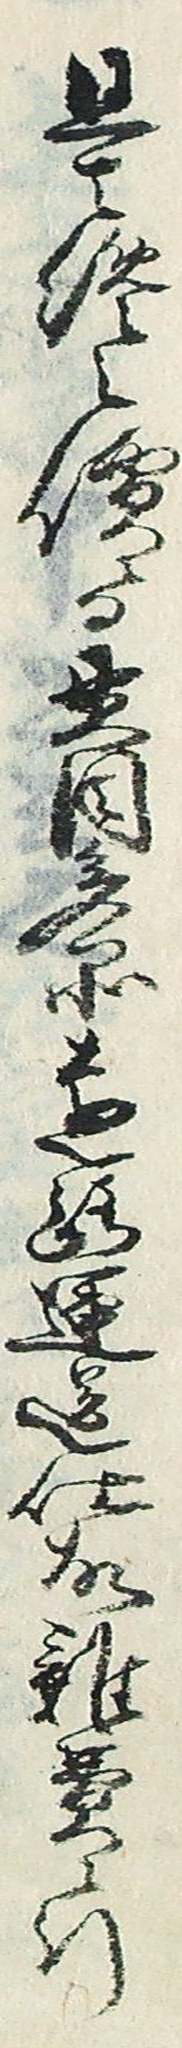且者纔之価に而貫目多品遠路運送仕故雑費に引
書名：油稼御取究ニ附御箇條書テ以被仰渡南北同役申談御答書控
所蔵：鳴門教育大学 Naruto University of Education
